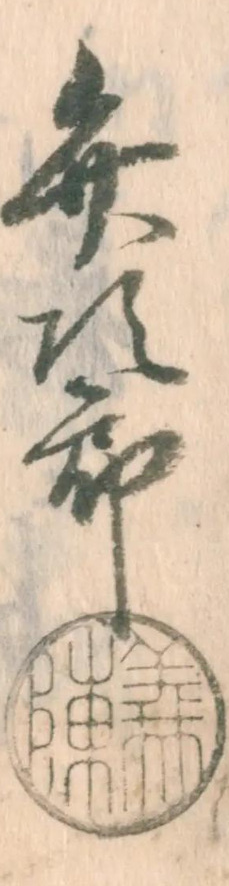弁次郎
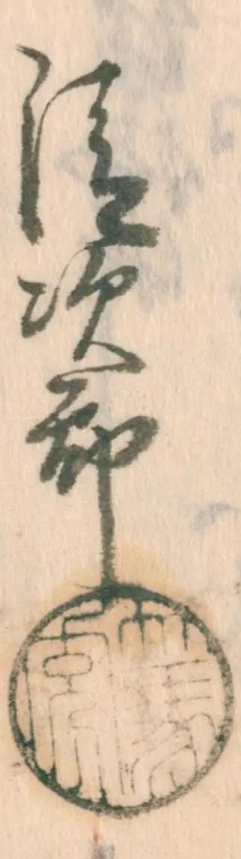清次郎
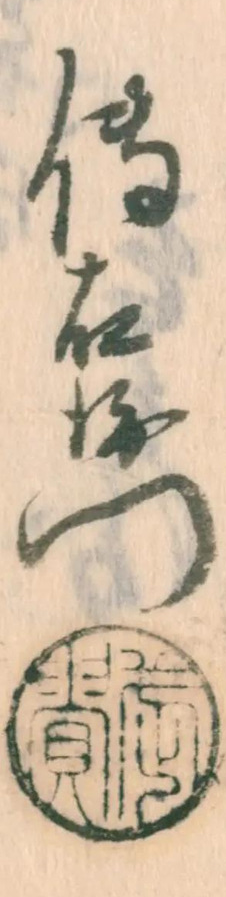伝右衛門
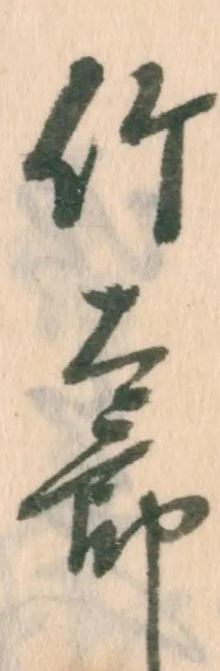竹太郎
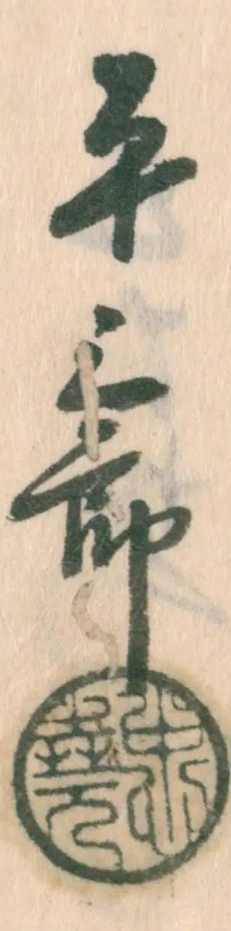平三郎

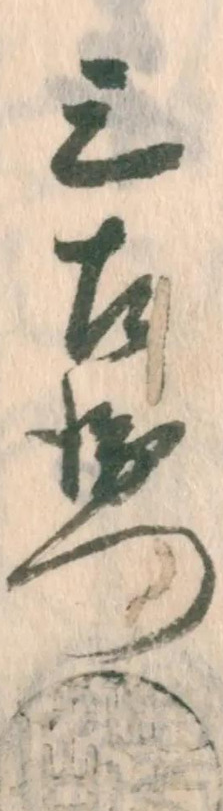三左衛門
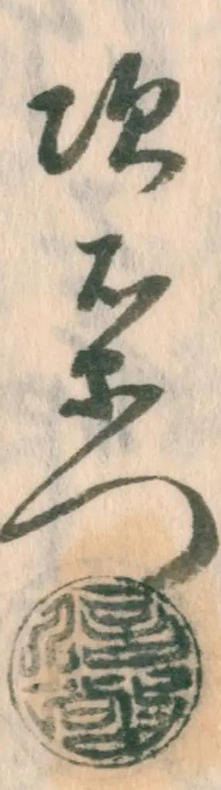次右衛門
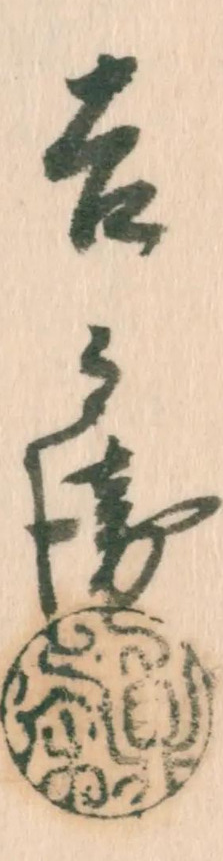吉兵衛
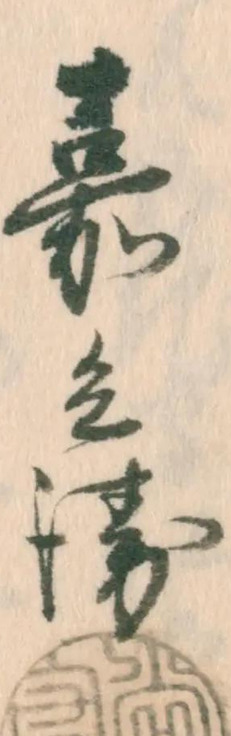嘉兵衛

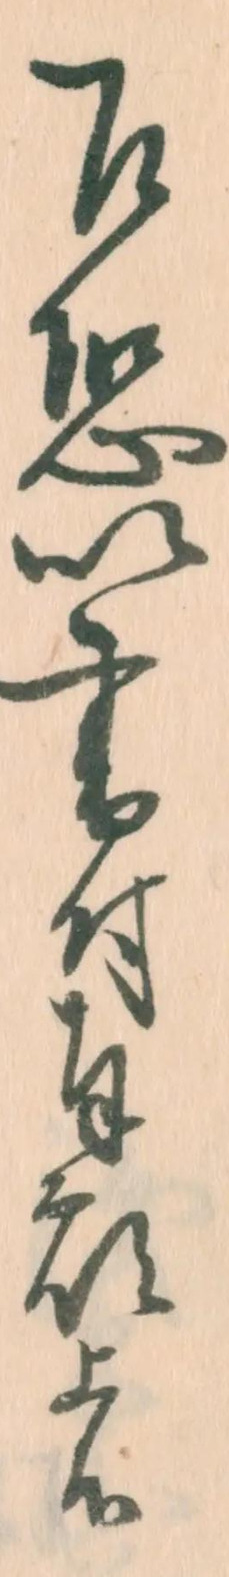乍恐以書付奉願上候
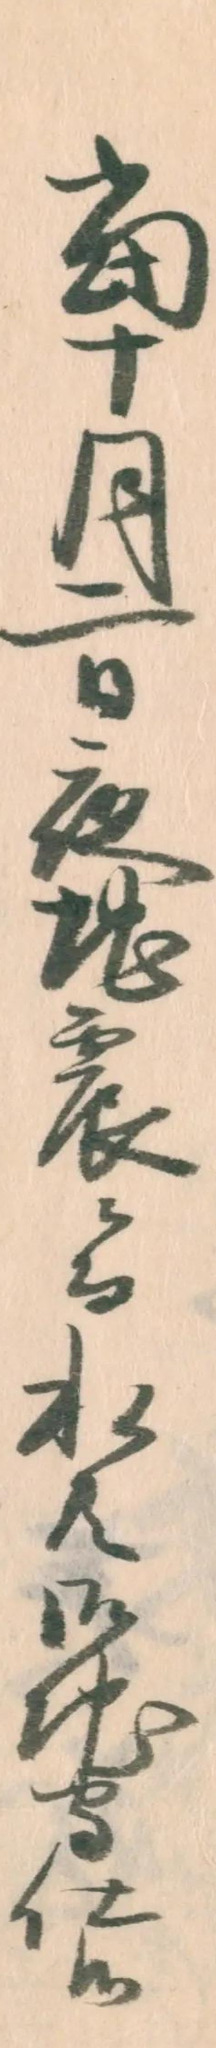一当十月二日夜地震ニ而私共御地守仕候
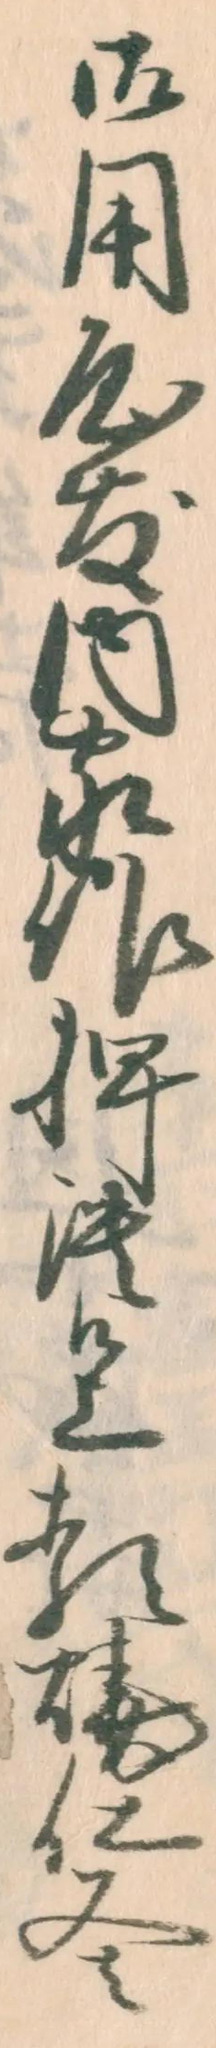御用屋敷内家作押潰候上類焼仕又は
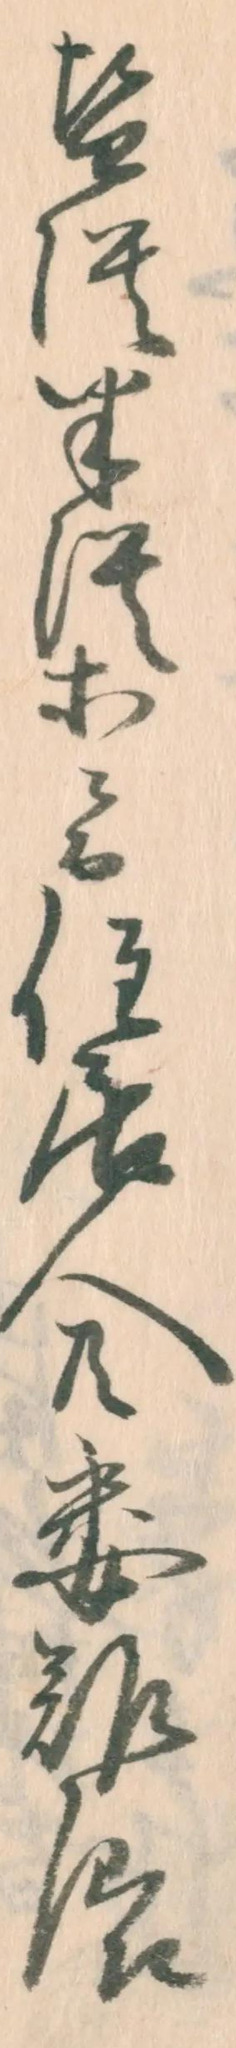皆潰半潰等に而住居人共悉難渋
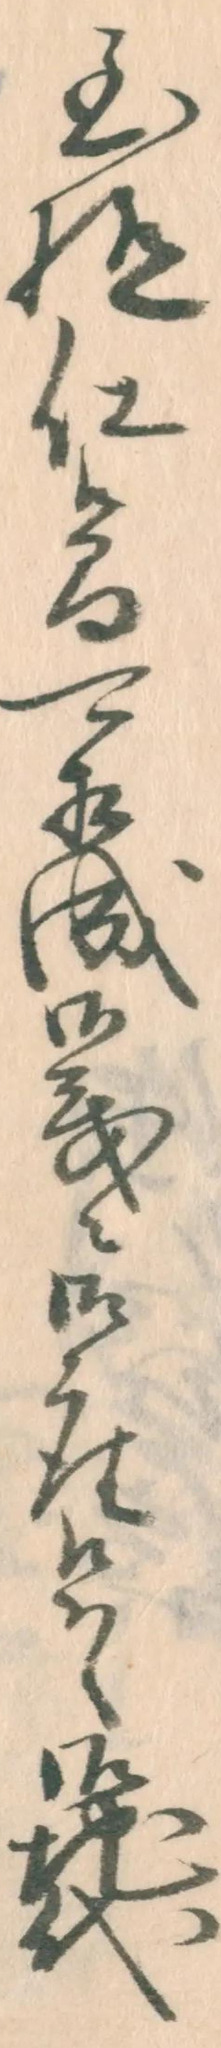至極仕候間可相成候義に御座候はゝ御地代
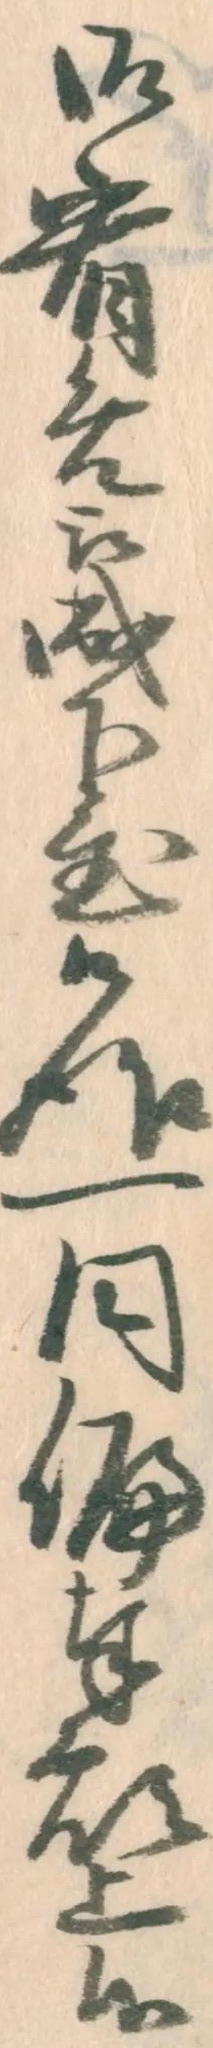御宥免被成下置候様一同偏奉願上候

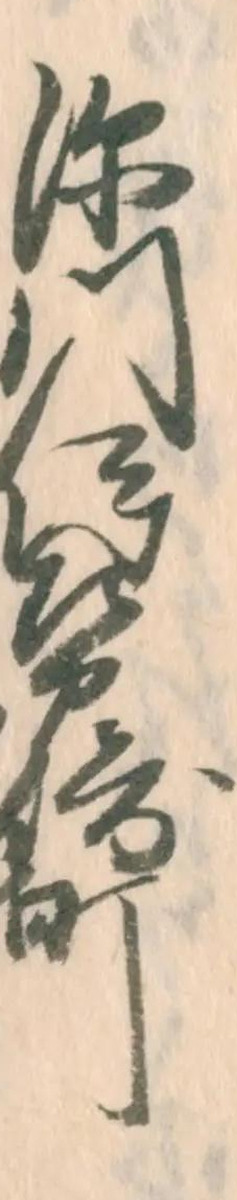深川伊勢崎町
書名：地震災書留 2巻. [1] 内表紙に「地震災書留　安政二卯年　但本所深川御用屋敷地代免除調」とあり
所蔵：国立国会図書館 National Diet Library, JAPAN
